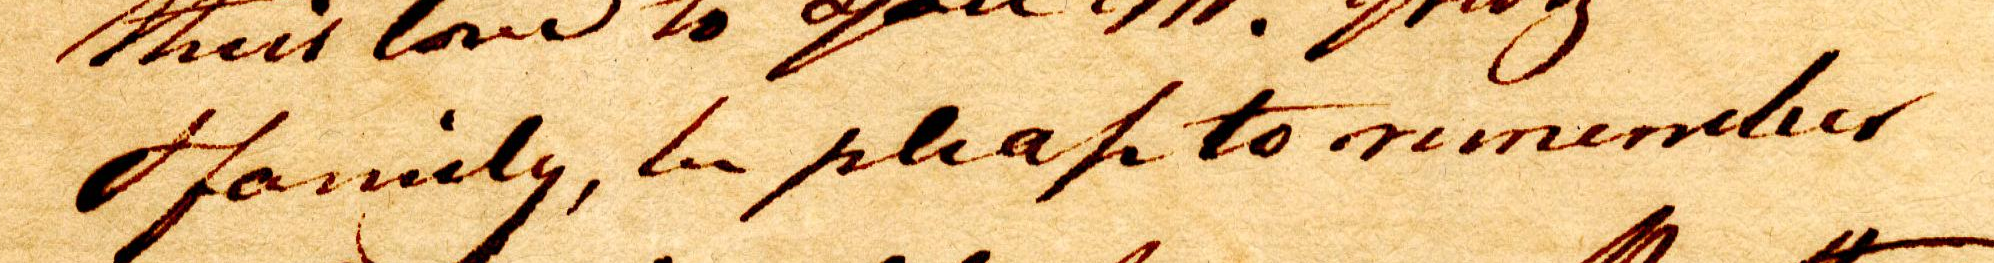& family, be please to remember
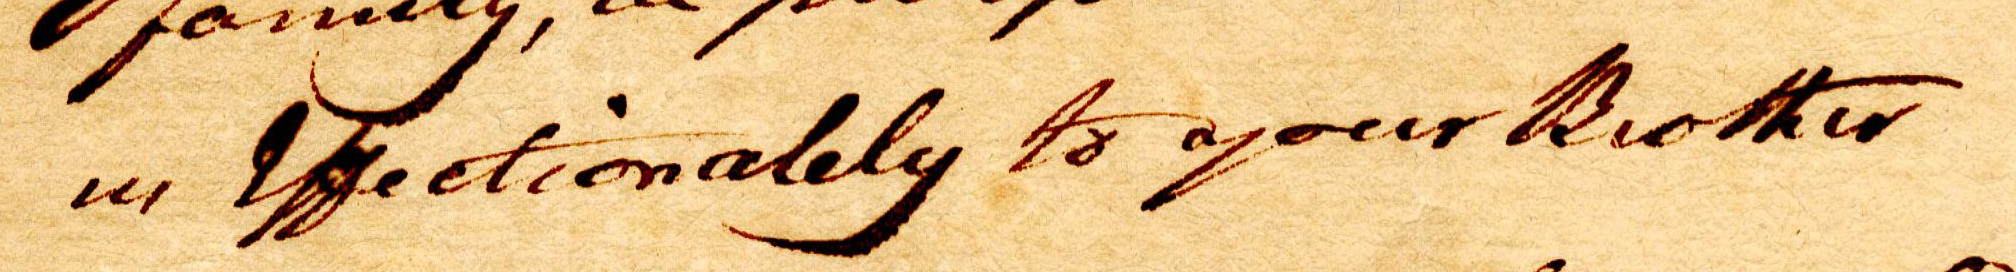us effectionately to your Brother
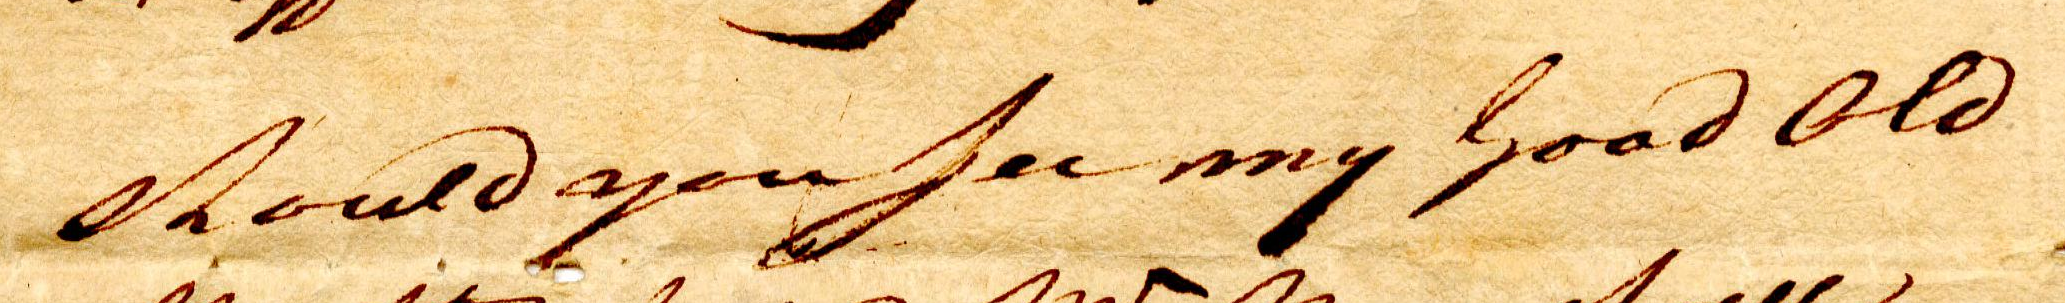should you see my Good Old
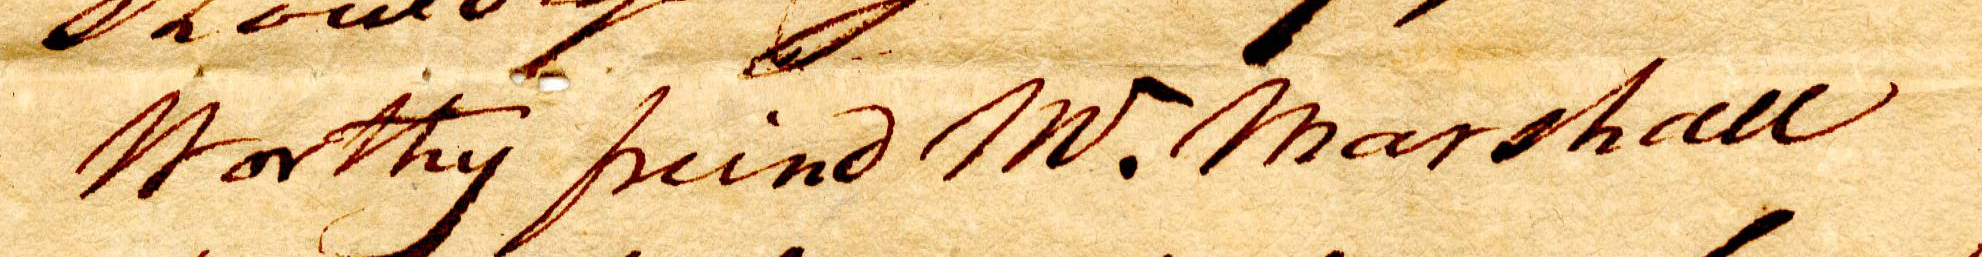Worthy friend M^r. Marshall
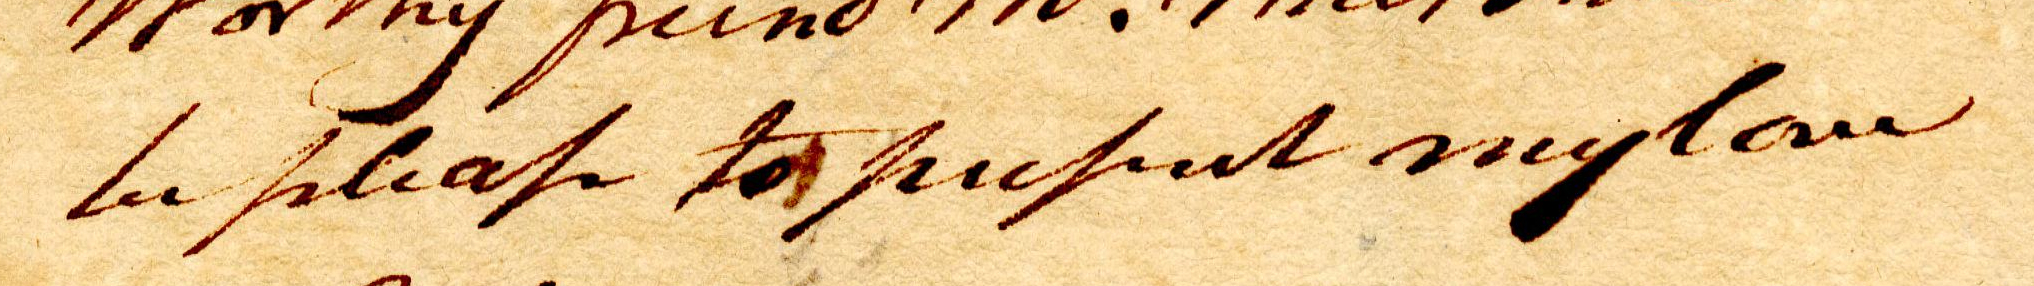be please to present my love
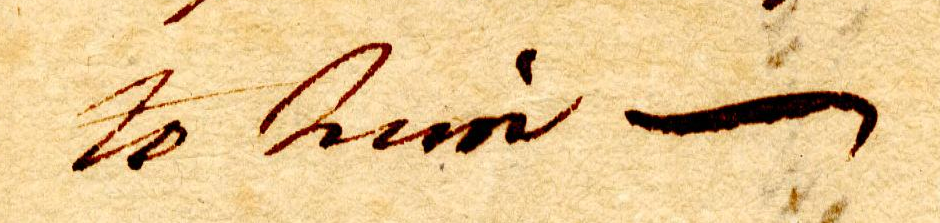to him.-
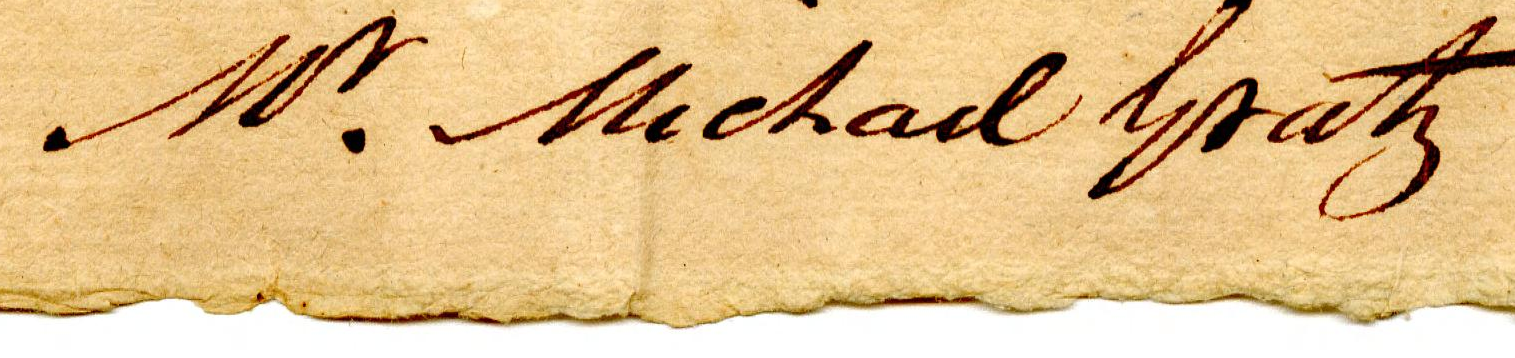M^r. Michael Gratz
